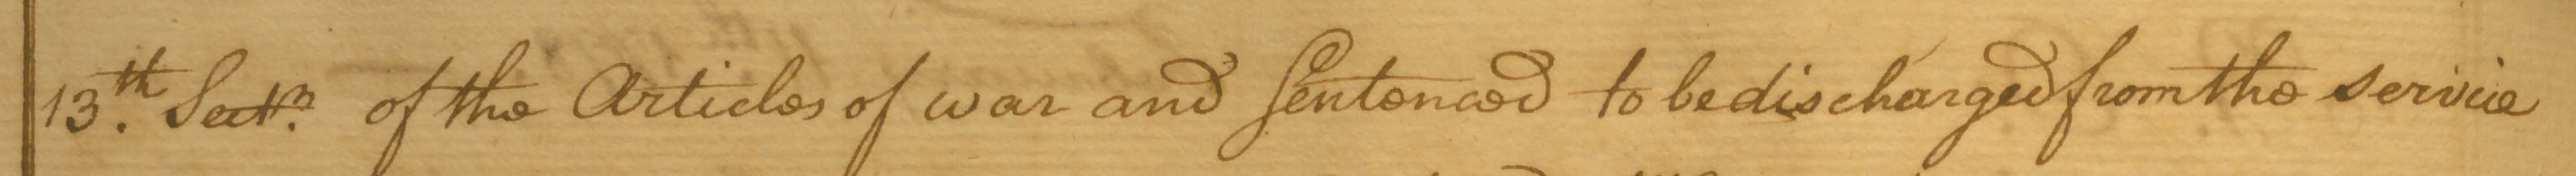13^th Sect^n. of the Articles of war and sentenced to be discharged from the service
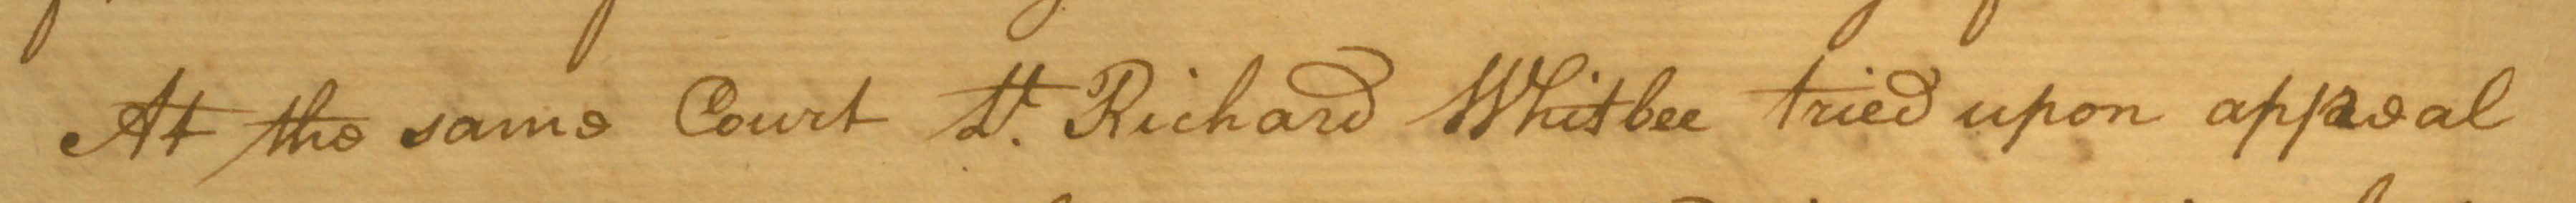At the same Court L^t. Richard Whitbee tried upon appeal
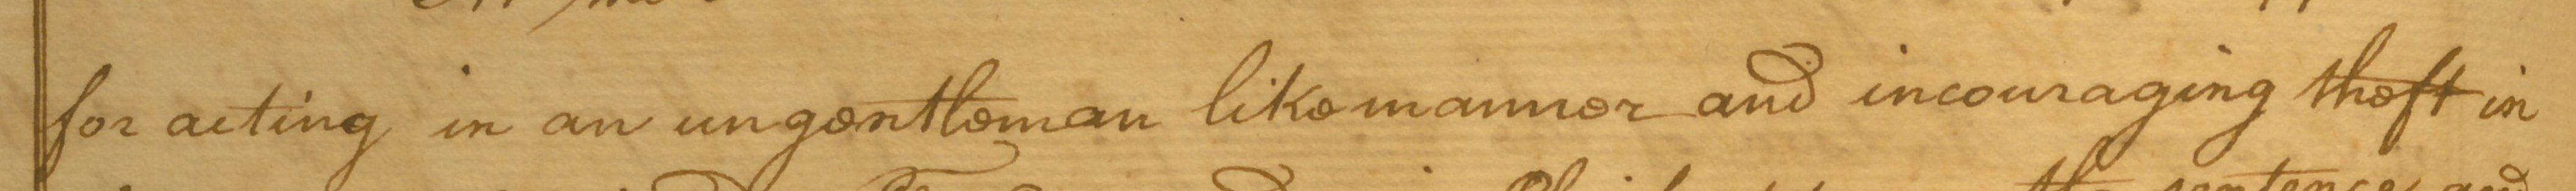for acting in an ungentleman like manner and incouraging theft in
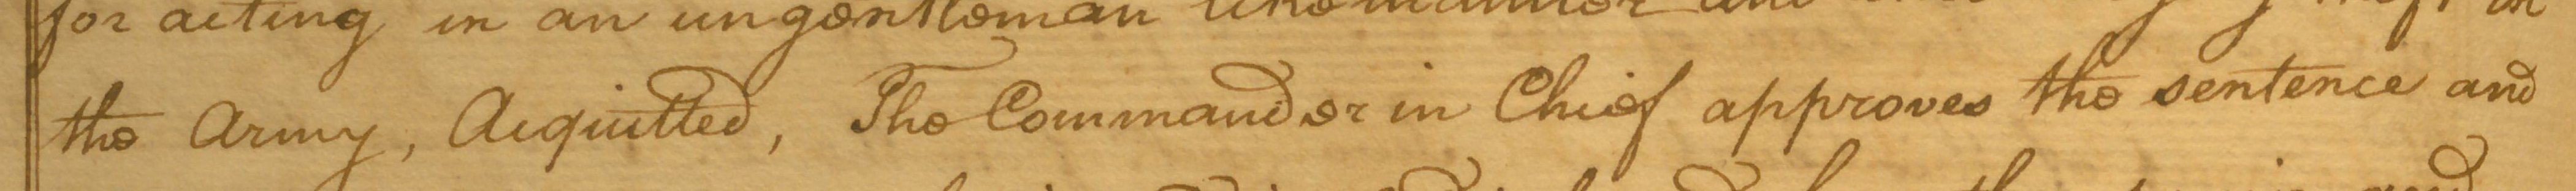the Army, Acquitted, The Commander in Chief approves the sentence and
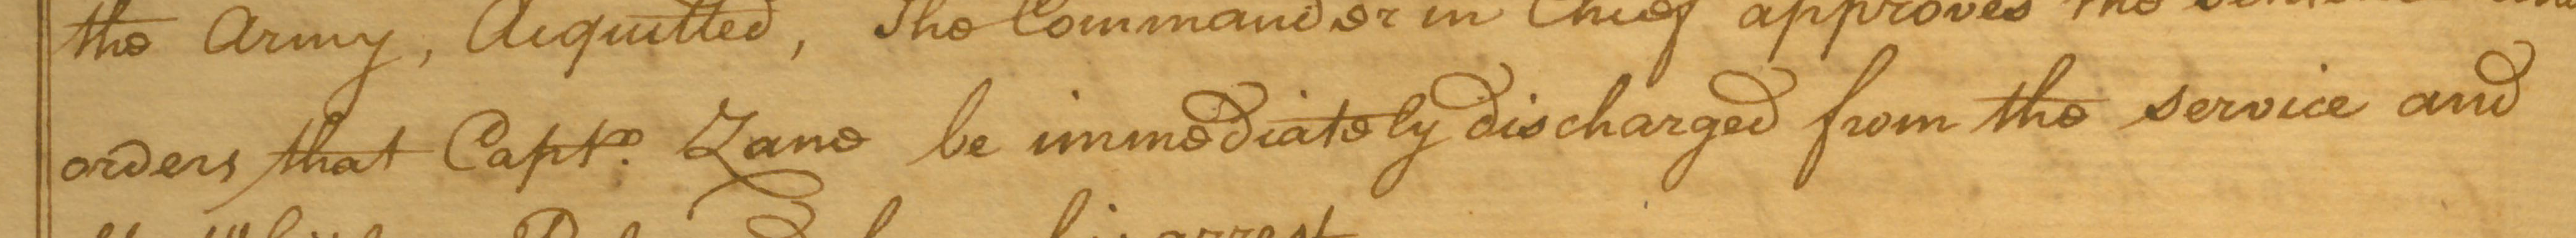orders that Capt^n. Zane be immediately discharged from the service and
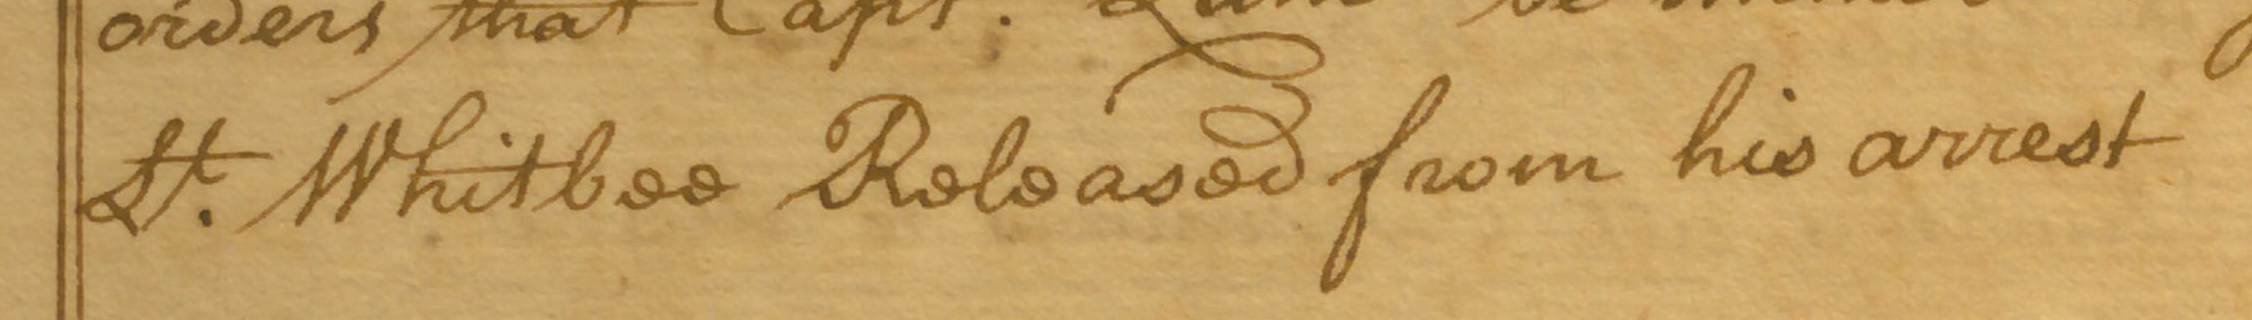L^t. Whitbee Released from his arrest
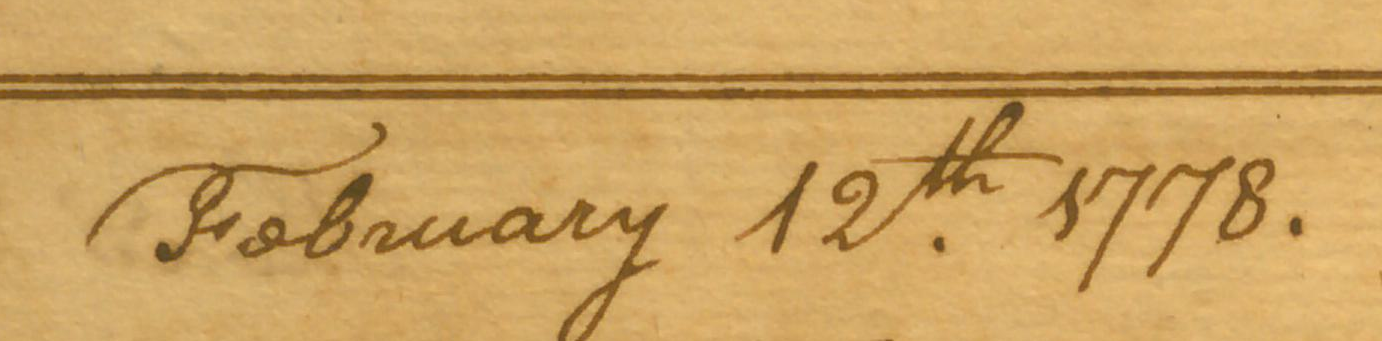February 12^th. 1778.
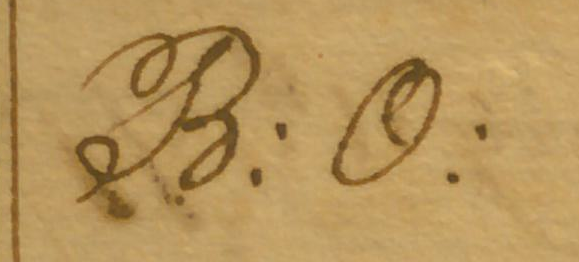B: O:
